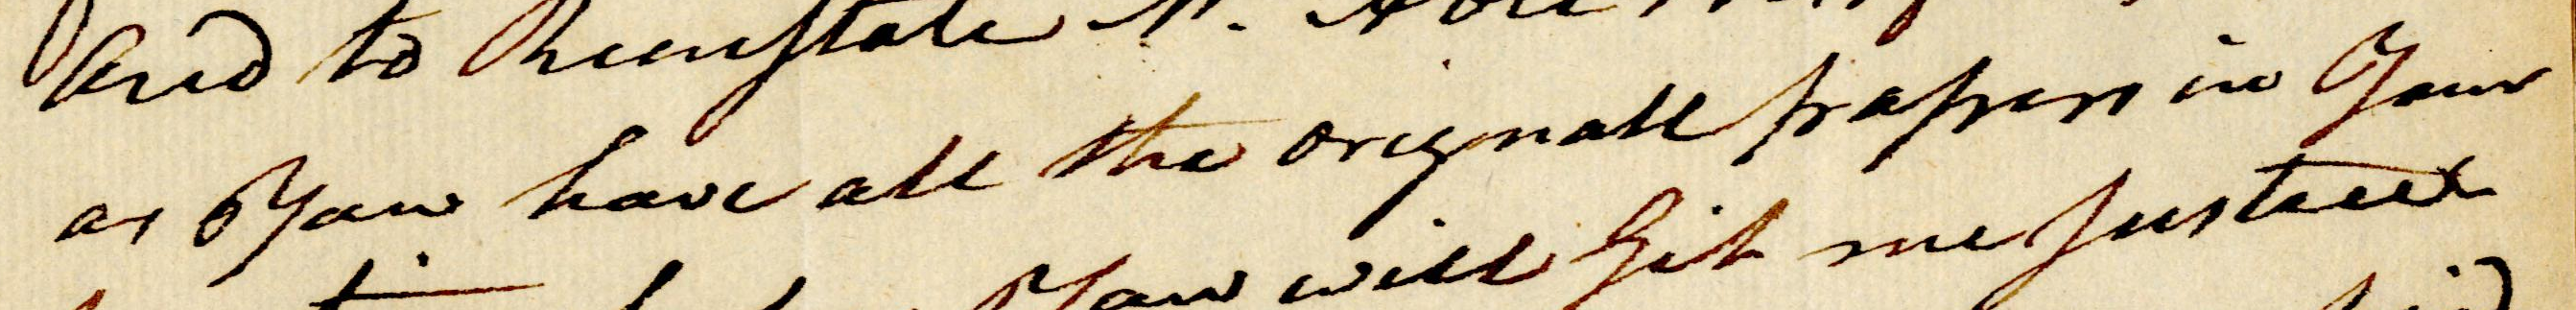as you have all the original papers in your
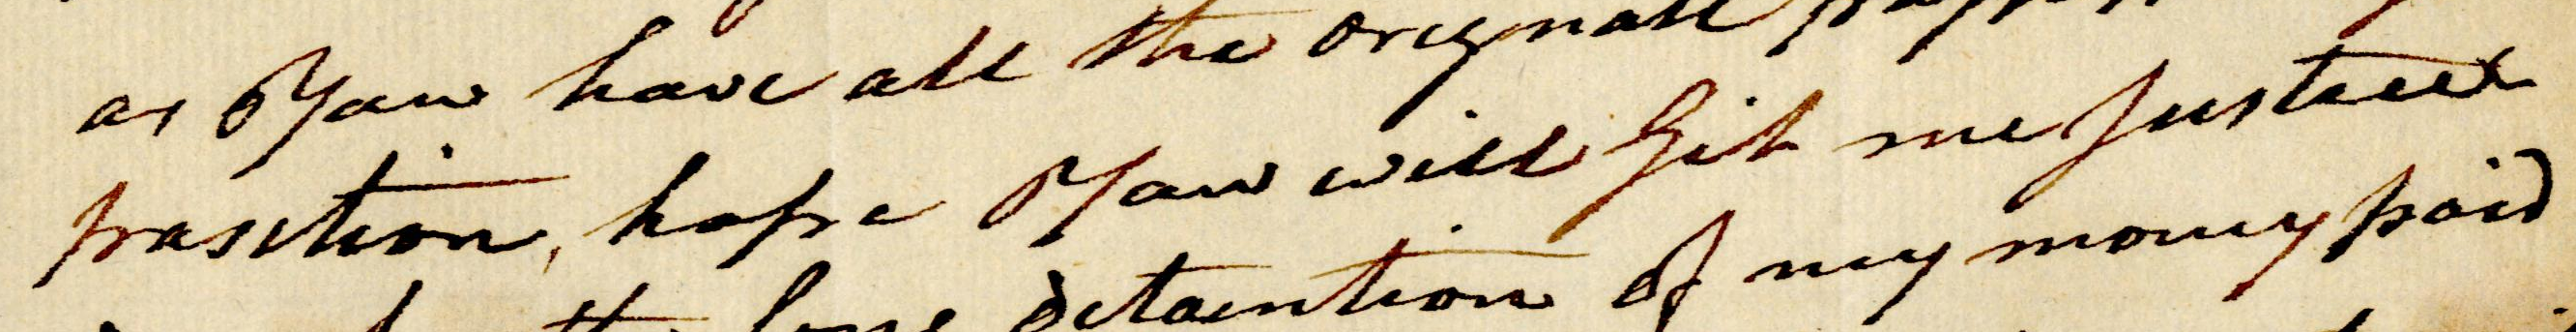position, hope will Git me justice
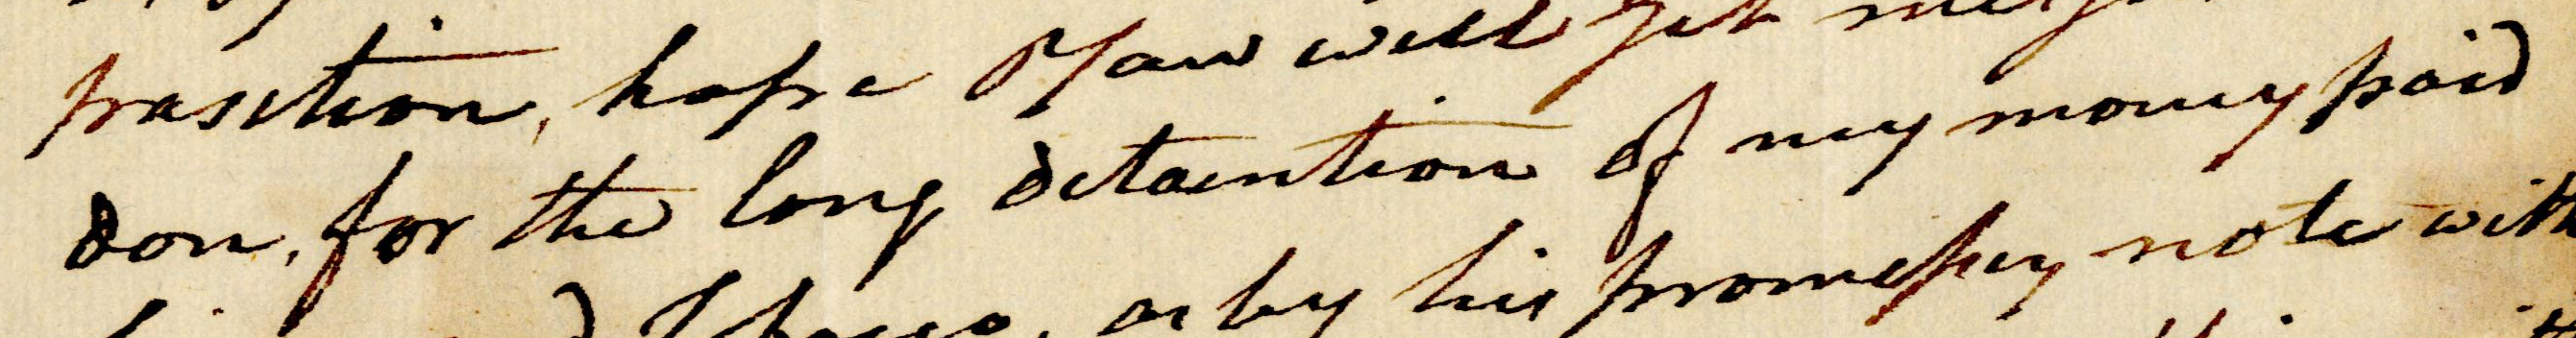don, for the long detention of my money paid
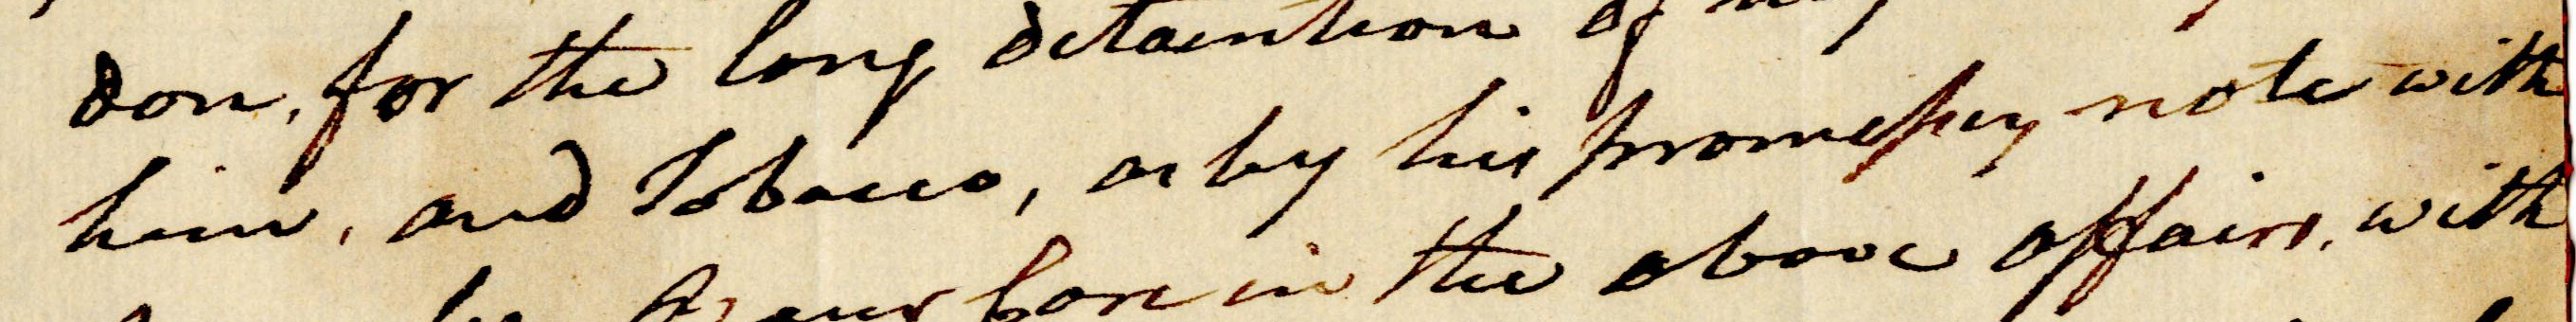him, and Tobacco, as by his promissary note with
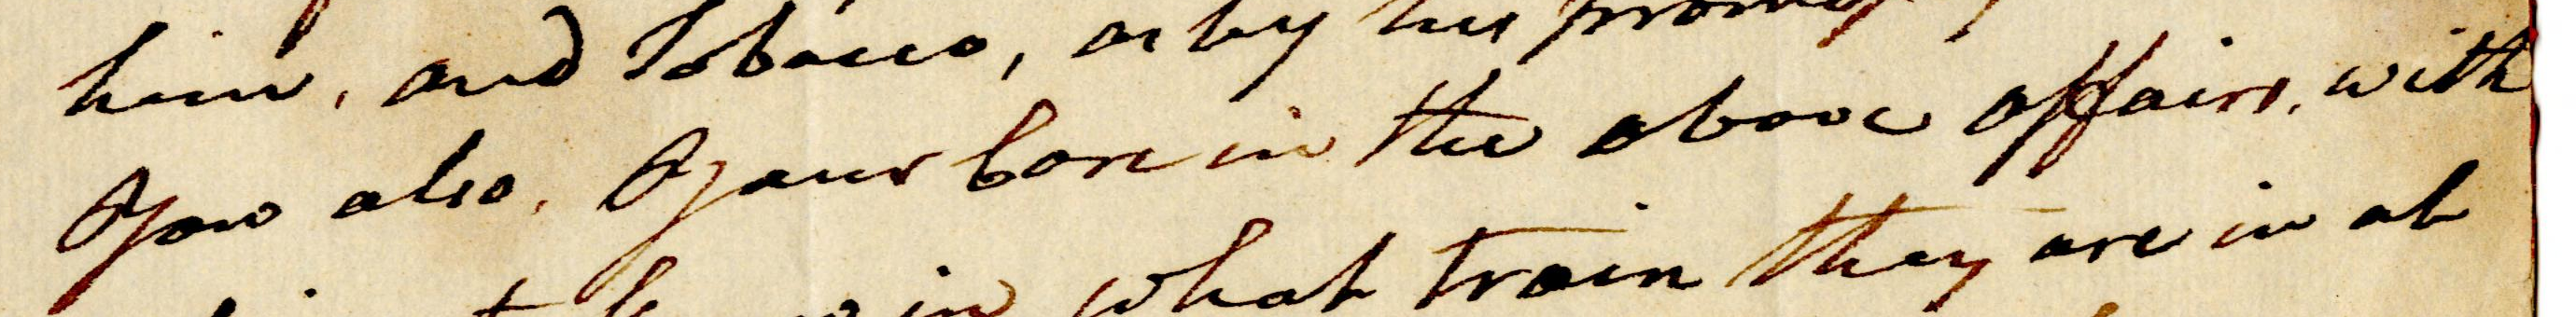you also, & your care in the above affairs with
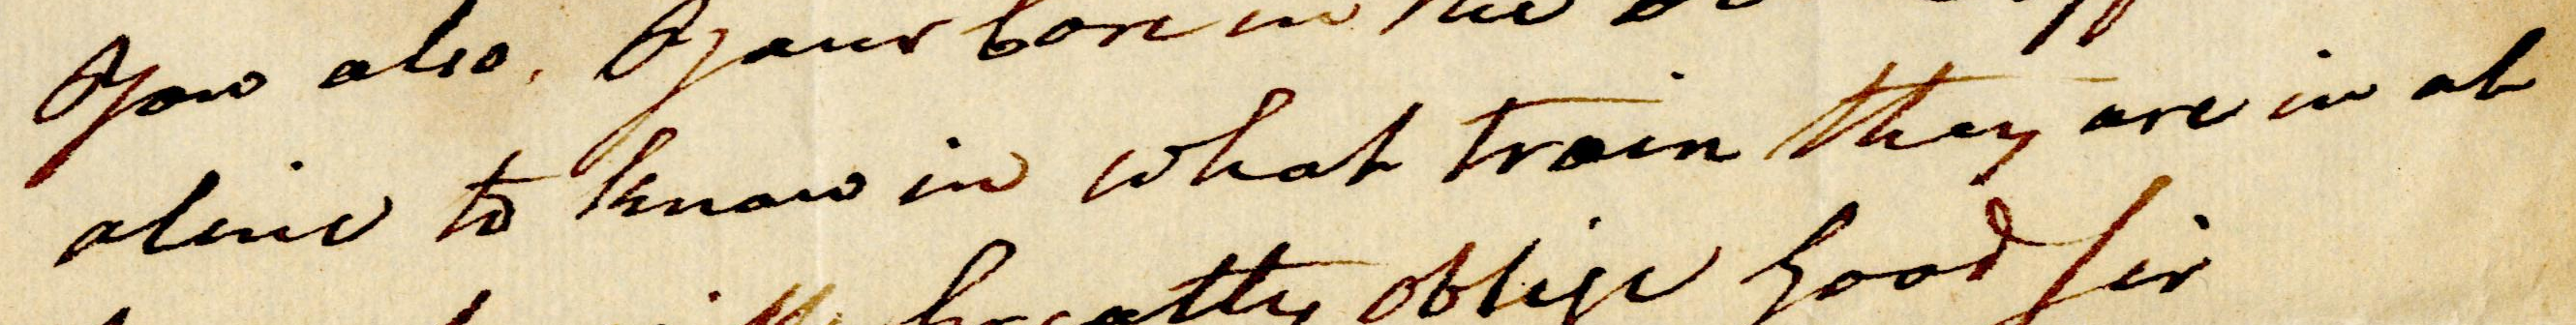a line to Know in what train they are in at
